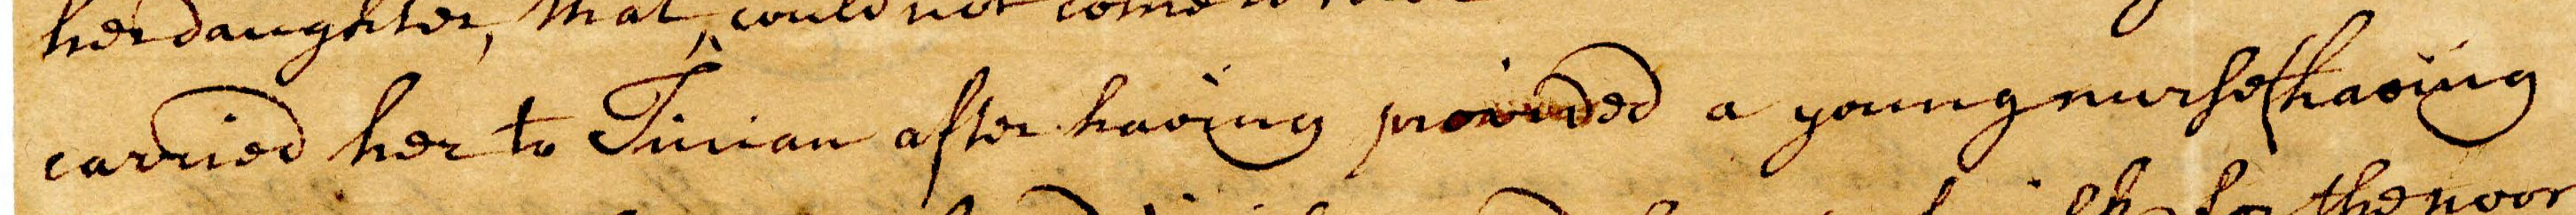carried her to Trivian after having provided a young nurse (having
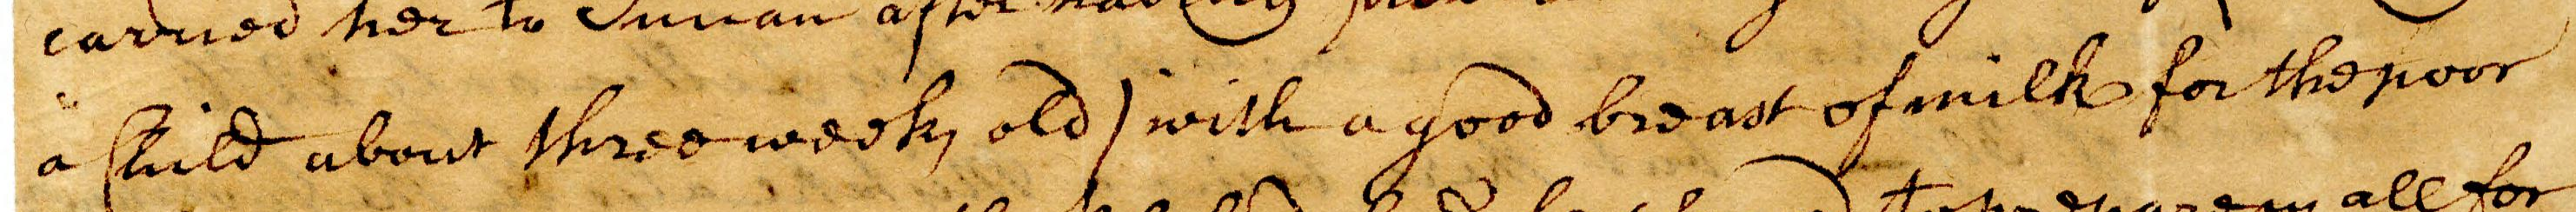a Child about three weeks old) with a good breast of milk for the poor
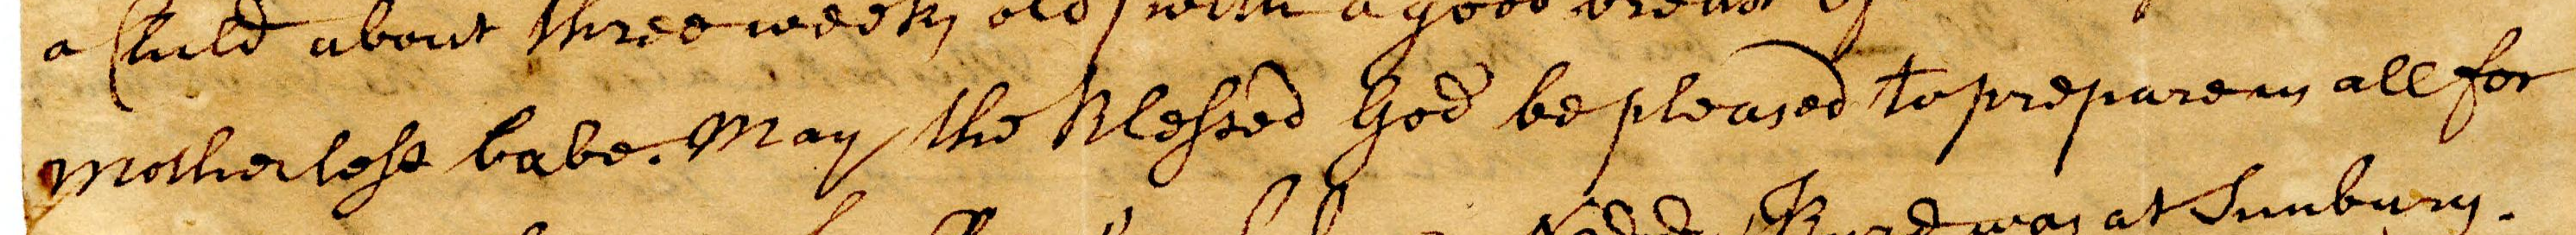motherless babe. May the Blessed God be pleased to prepare us all for
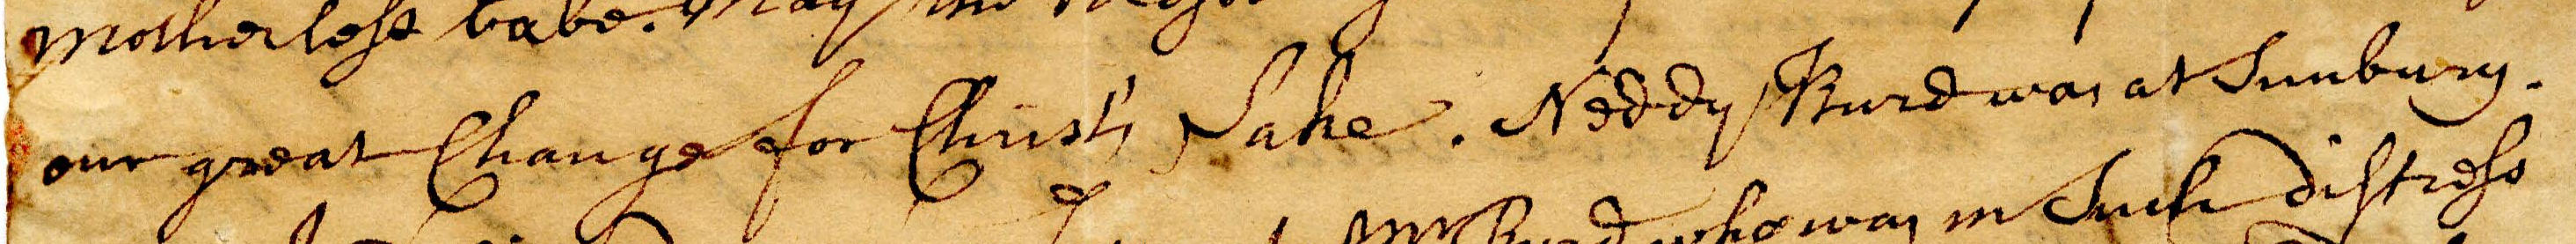our great Change for Christ's Sake. Neddy Burd was at Sunbury.
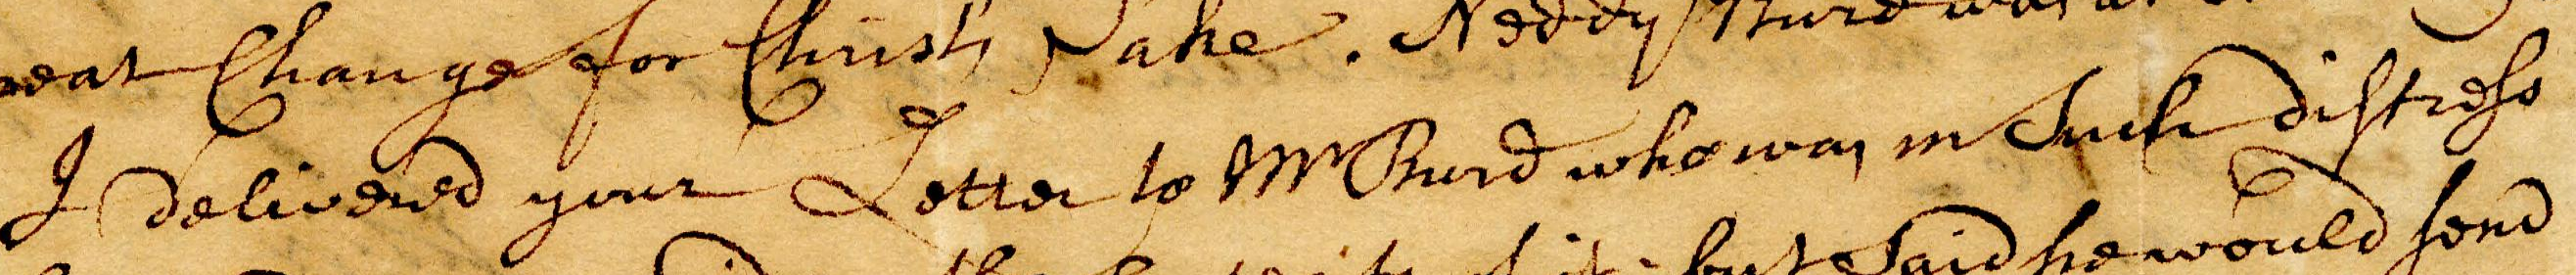I delivered your Letter to M^r Burd who was in Such distress
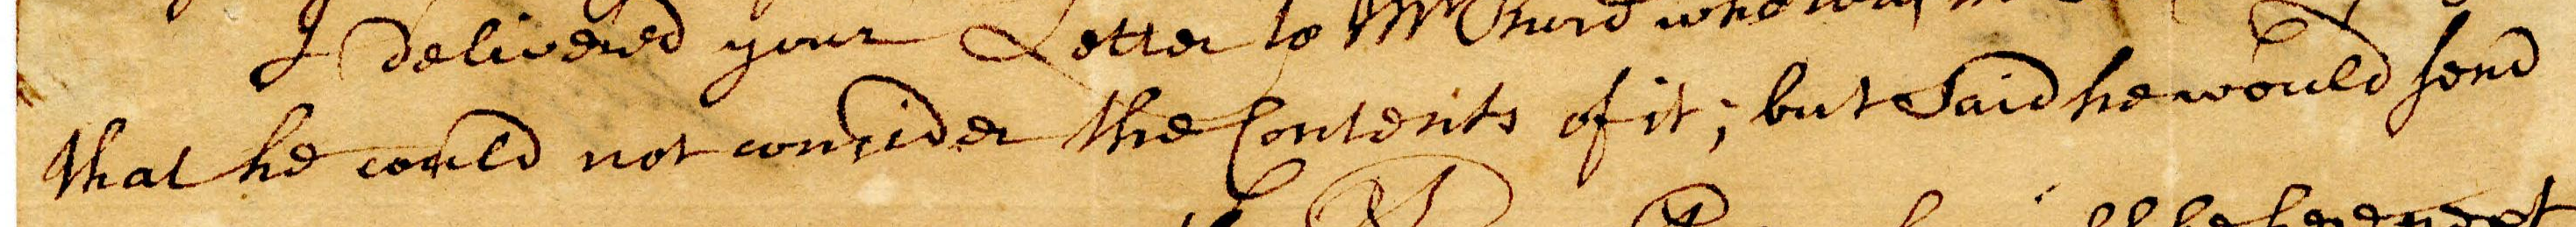that he could not consider the Contents of it; but said he would send
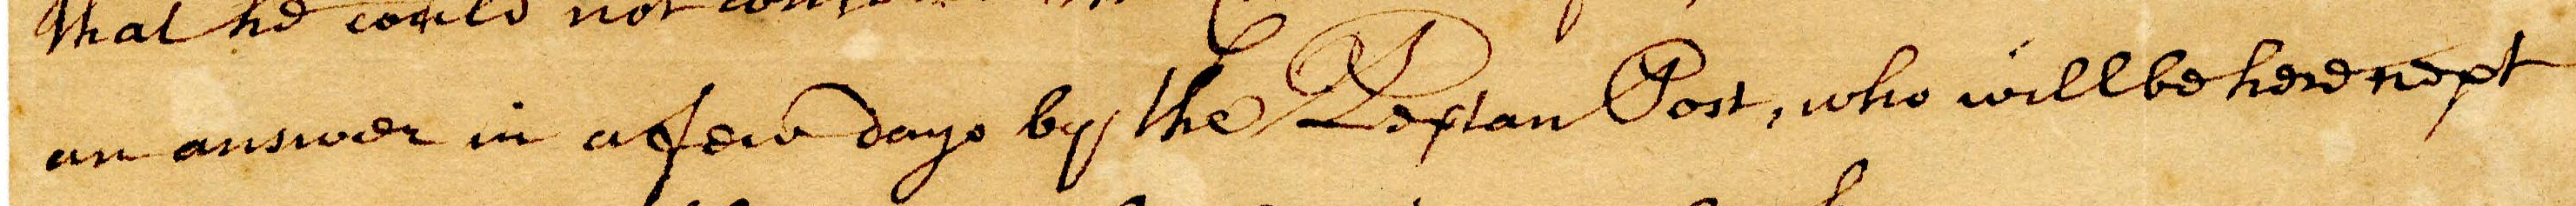an answer in a few days by the Lexlan Post, who will be here next
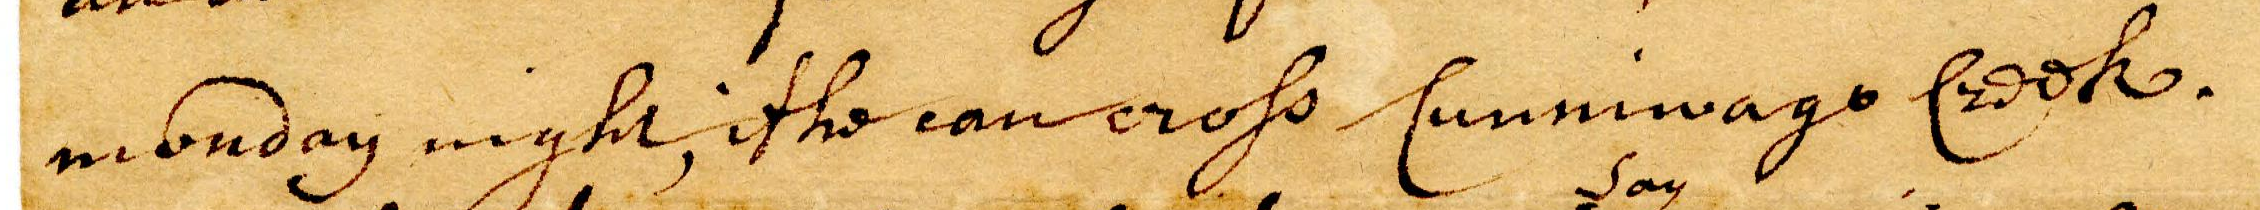monday night, if he can cross Cunniwage Creek.
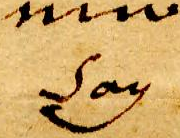Say
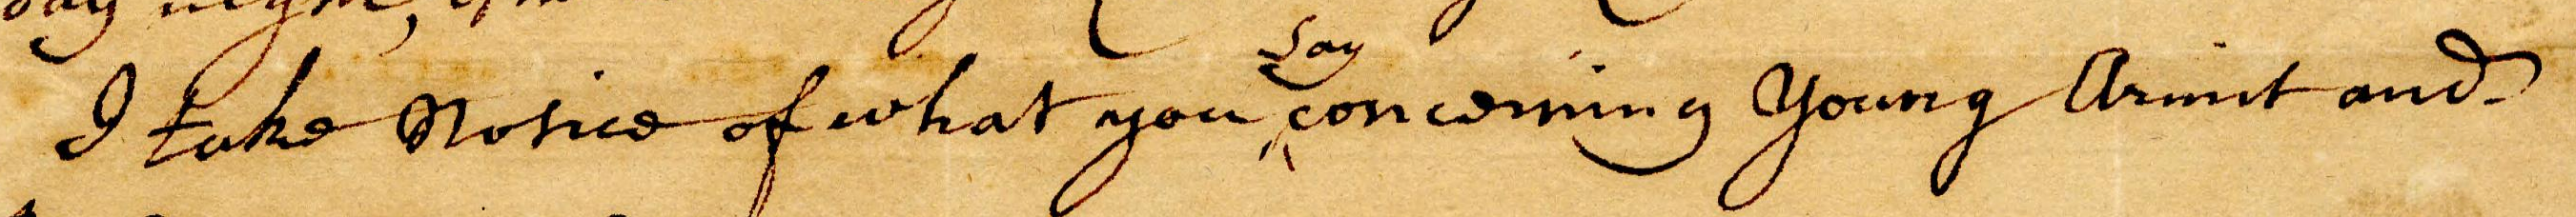I take Notice of what you ^ concerning Young Armit and
